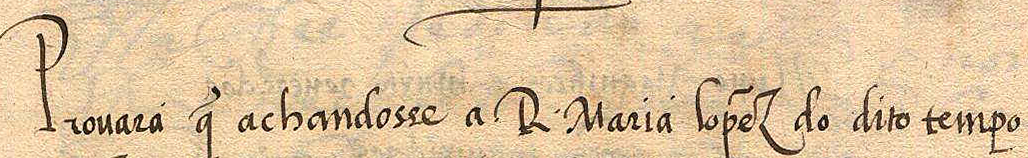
Prouara q̅ achandosse a R. Maria lop̅eZ do dito tempo
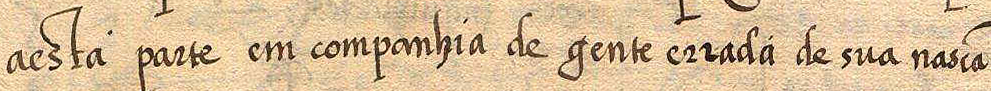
a esta parte em companhia de gente errada de sua nasc̅a
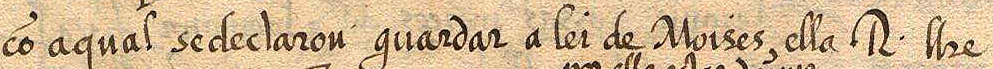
co̅ a qual se declarou guardar a lei de Moises, ella R. lhe
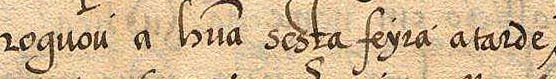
roguou a hu̅a sesta feyra a tarde
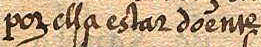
por ella estar doente
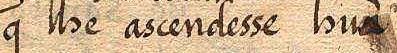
q̄ lhe ascendesse hūa
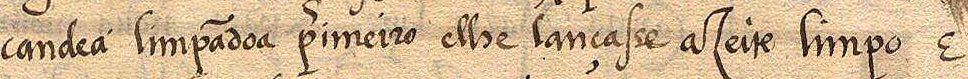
candea limp̅adoa p̅imeiro e lhe lançasse aZeite limpo E
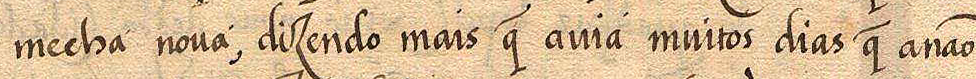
mecha noua, diZendo mais q̅ auia muitos dias q̅ a não
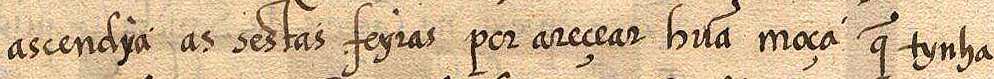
ascendya as sestas feyras por areçear hu̅a moça q̅ tynha
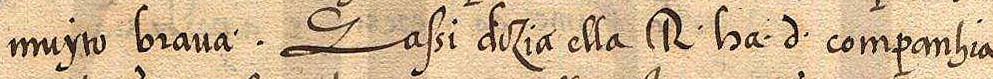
muyto braua. E assi diZia ella R. ha d. companhia
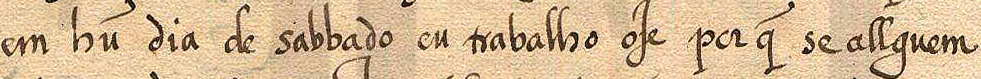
em hu̅ dia de sabbado eu trabalho oJe porq̅ se allguem
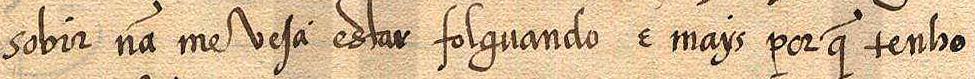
sobir na̅ me veja estar folguando E mays porq̅ tenho
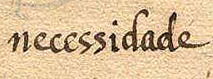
necessidade
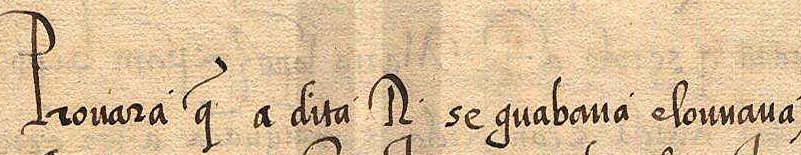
Prouara q̅ a dita R se guabaua e louuaua
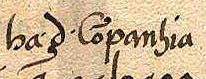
ha .d. Co̅panhia
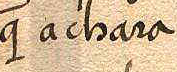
q̅ achara
